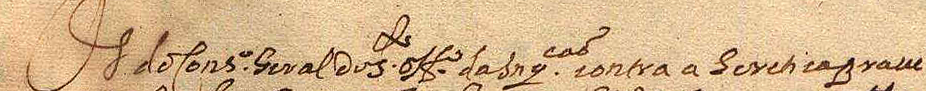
Os do Cons.o Geral do s.to off.o da Inq.caõ contra a heretica praui
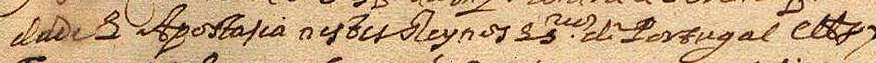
dade E Apostasia nestes Reynos E s.rios de Portugal ettꝭ
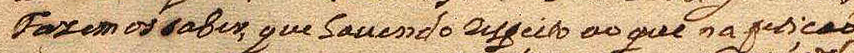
Fazemos saber, que hauendo respeito ao que na petiçaõ
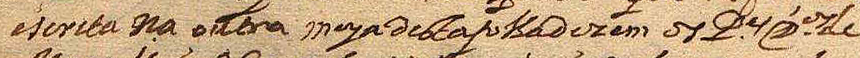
escrita na outra meya desta folha dizem os P.es D.os de
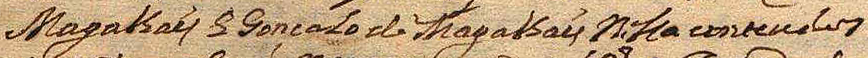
Magalhaẽs E Gonçalo de Magalhaẽs nella conteudos
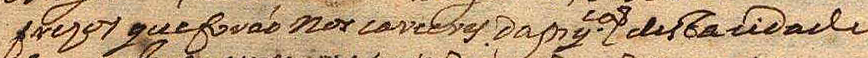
prezos que foraõ nos carceres da jnq.caõ desta cidade
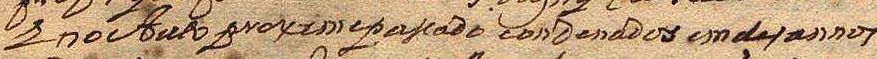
E no Auto proxime passado condenados em des annos
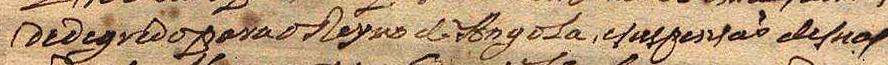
de degredo para o Reyno de Angola, e suspensaõ de suas
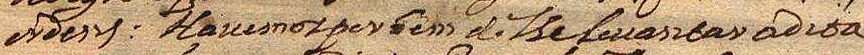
ordens: Hauemos por bem de lhe leuantar a dita
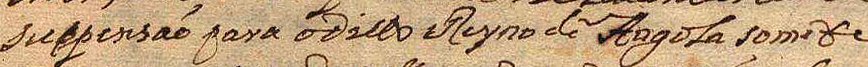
suspensaõ para o ditto Reyno de Angola somēte
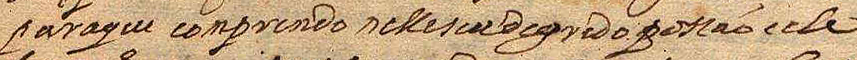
para que comprindo nelle seu degredo possaõ cele
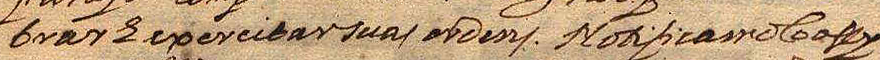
brar E exercitar suas ordens. Notificamolo assy
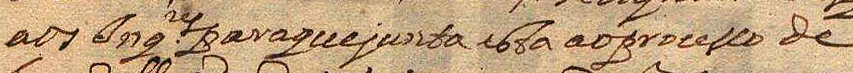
aos Inq.res para que junta esta ao processo de
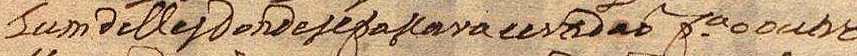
hum delles donde se passara certidaõ p.a o outro
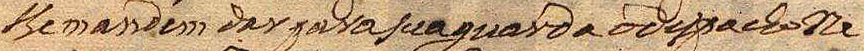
lhe mandem dar para sua guarda o despacho ne
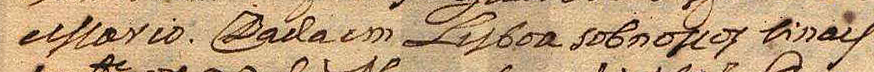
cessario. Dada em Lisboa sob nossos sinais
